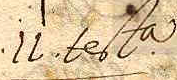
.11. test.a
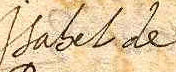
Jsabel de
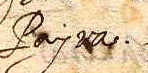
Payva.
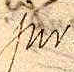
Jur.
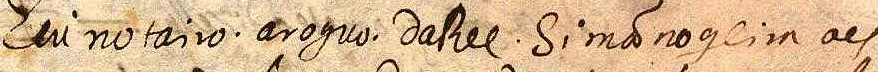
E eu notairo a roguo da Ree Simaõ nogeira o es
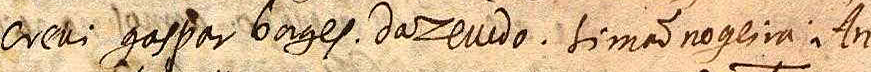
creui gaspar borges dazeuedo. simaõ nogeira. An
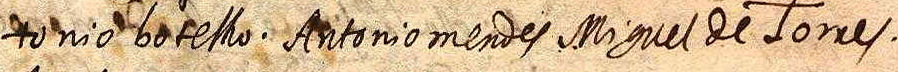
tonio botelho. Antonio mendes Miguel de Torres.
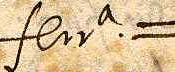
ferra.
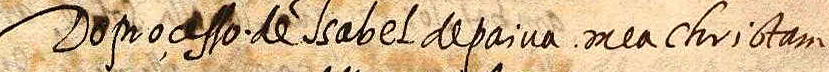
Do processo de Isabel de paiua mea christam
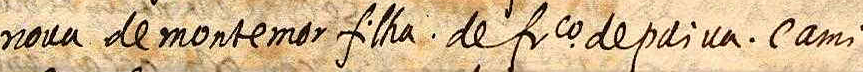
noua de montemor filha de frco. de paiua cami
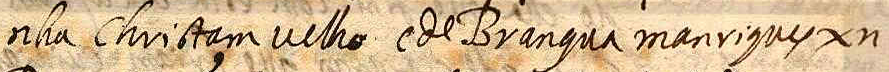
nha christam uelho e de Branqua manriques xn.
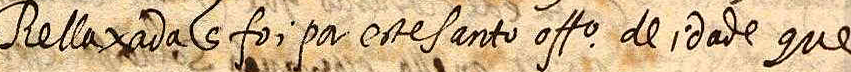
Rellaxada q̄ foi por este santo offo de idade que
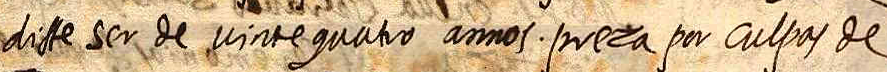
disse ser de uinte quatro annos. preza por culpas de
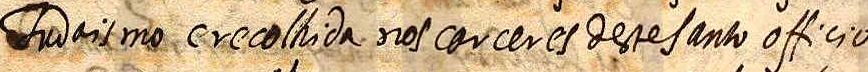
Iudaismo e recolhida nos carceres deste santo officio
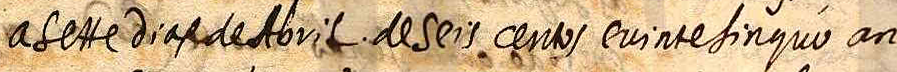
a sette dias de Abril de Seiscentos e uinte sinquo an
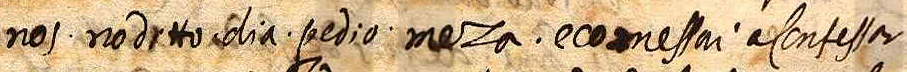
nos no ditto dia pedio meza e comessou a Confessar
